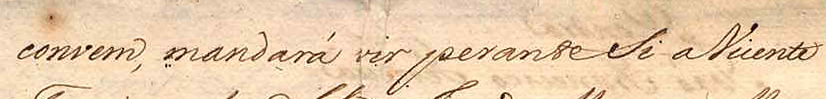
convem, mandará vir perante Si a Vicente
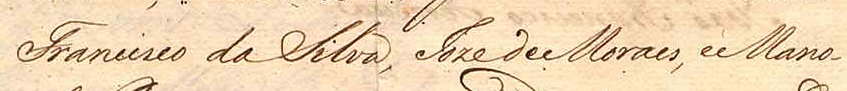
Francisco da Silva, Ioze de Moraes, e Mano
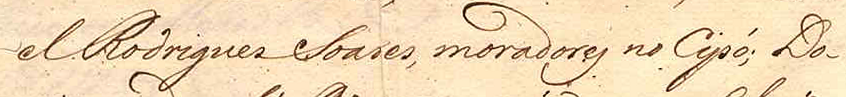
el Rodrigues Soares, moradores no Cipó; Do
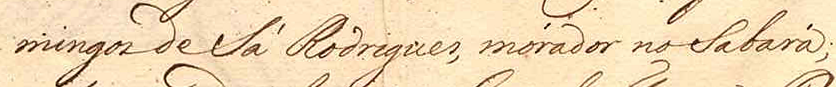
mingos de Sá Rodrigues, morador no Sabará;
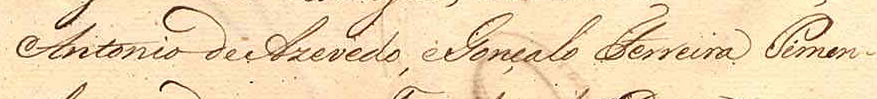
Antonio de Azevedo, e Gonçalo Ferreira Pimen
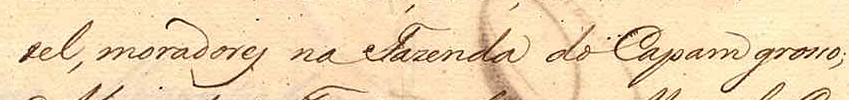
tel, moradores na Fazenda do Capam grosso,
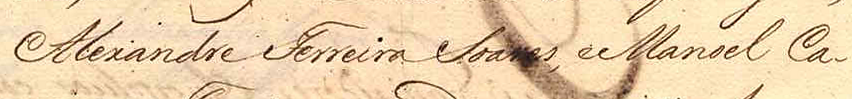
Alexandre Ferreira Soares, e Manoel Ca
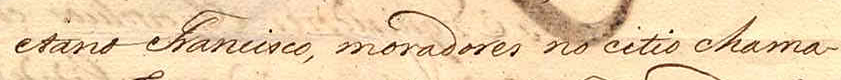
etano Francisco, moradores no citio chama
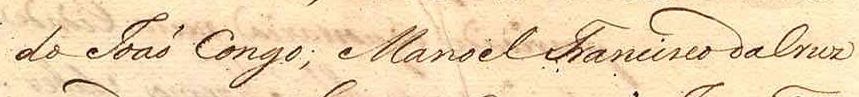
do Joaõ Congo; Manoel Francisco da Cruz
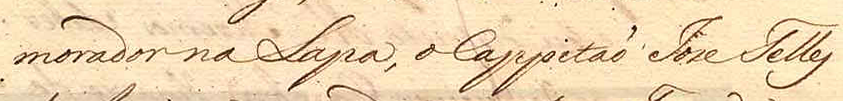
morador na Lapa, o Cappitaõ Joze Telles
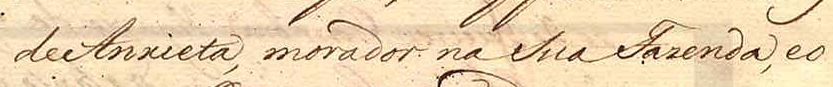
de Anxieta, morador na sua Fazenda, e o
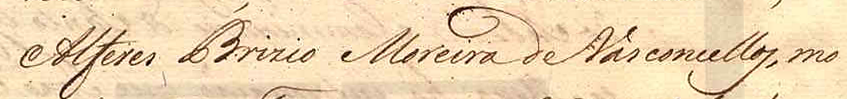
Alferes Brizio Moreira de Vasconcellos, mo
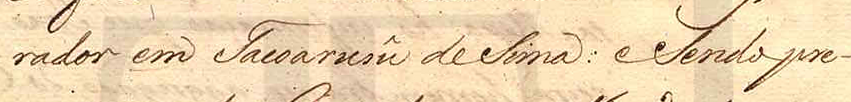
rador em Tacoarusú de Sima; e Sendo pre
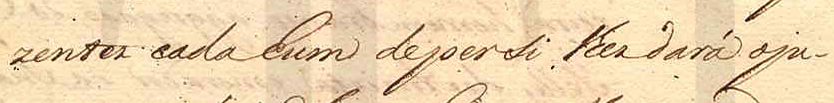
zentes cada hum de per si lhes dará o ju
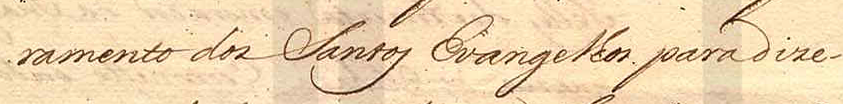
ramento dos Santos Evangelhos para dize
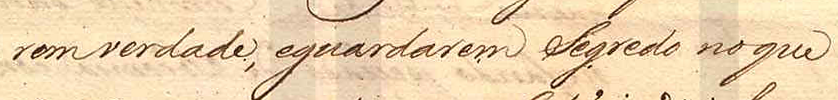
rem verdade, e guardarem Segredo no que
